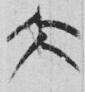大
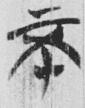不
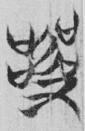○（亂）
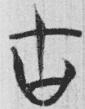古（故）
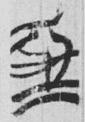爲
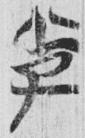{少子}（少）
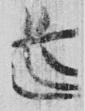必
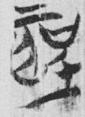聖（聽）
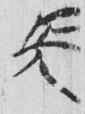長
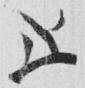之
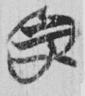命
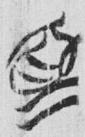爲
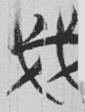戔（賤）
